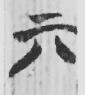亓
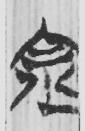余
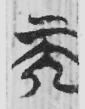而
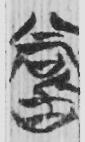嘗
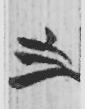之
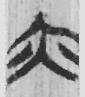亦
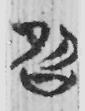卲
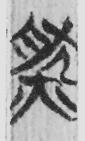然
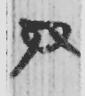四
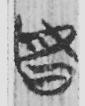{母日}（海）
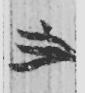之
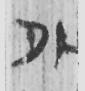外
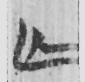亡
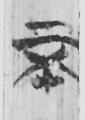不
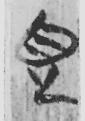見
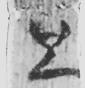也
